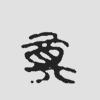奠
